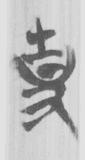吏
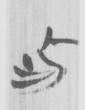此
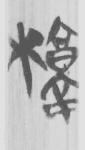{木亯羊}
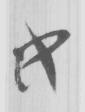女
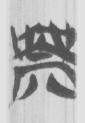{舛亼几}
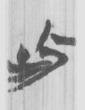此
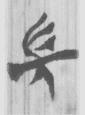𡵂
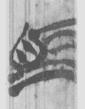馬
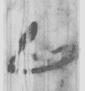㠯（以）
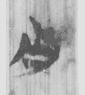舟
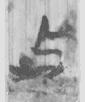此
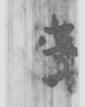{十五}
